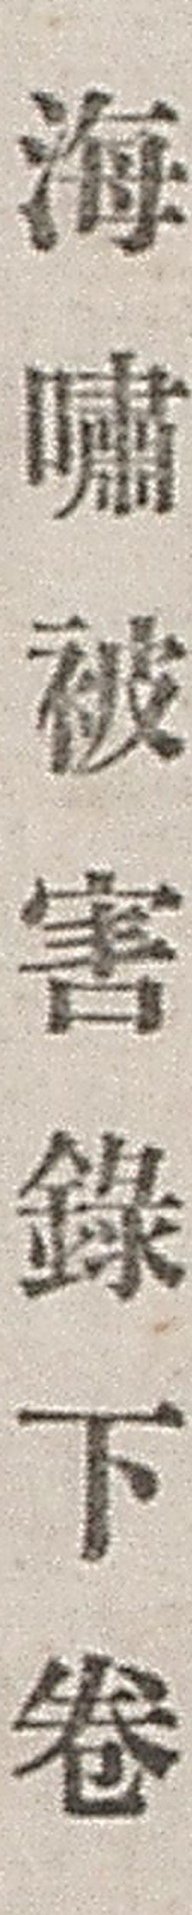海嘯被害録下巻
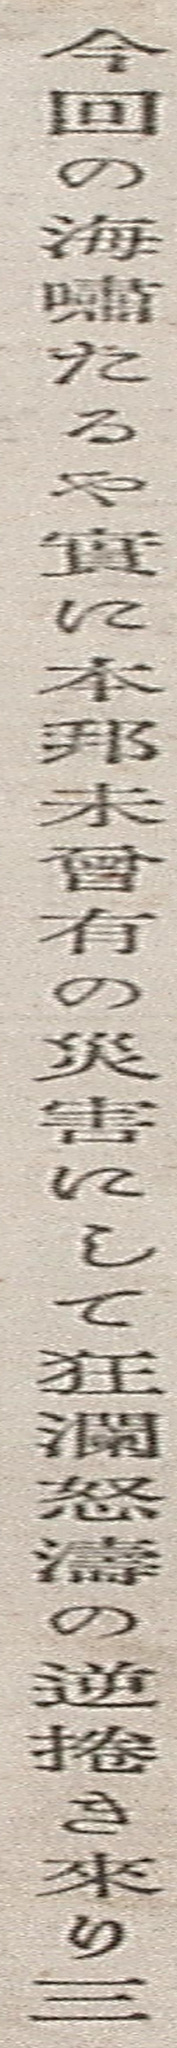今回の海嘯たるや実に本邦未曽有の災害にして狂瀾怒濤の逆捲き来り三
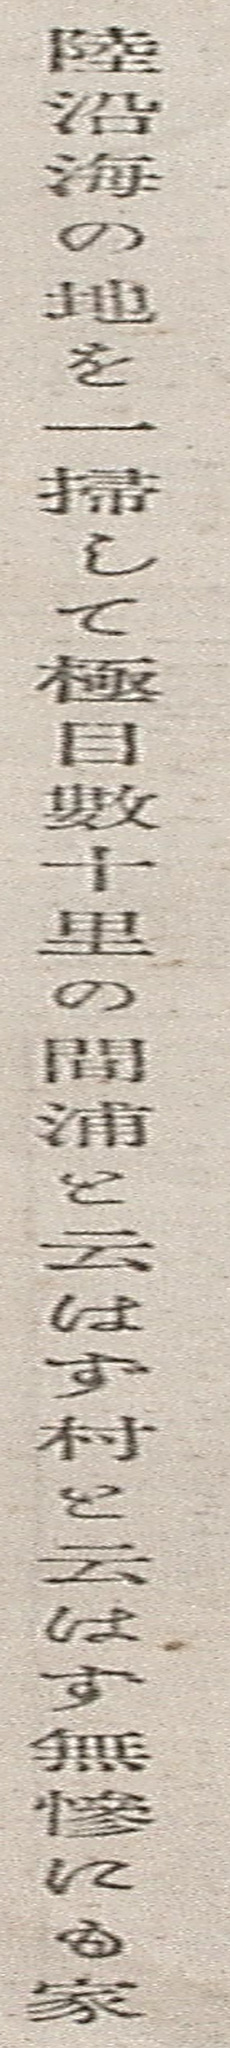陸沿海の地を一掃して極目数十里の間浦と云はず村と云はず無惨にも家
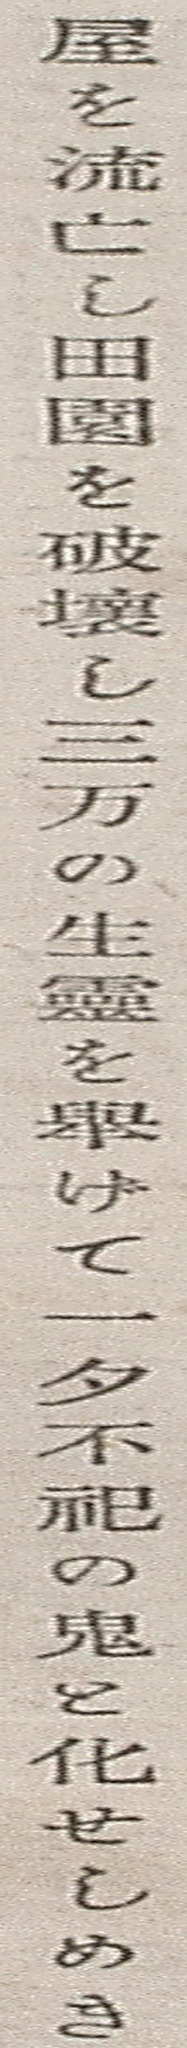屋を流亡し田園を破壊し三万の生霊を挙げて一夕不祀の鬼と化せしめき
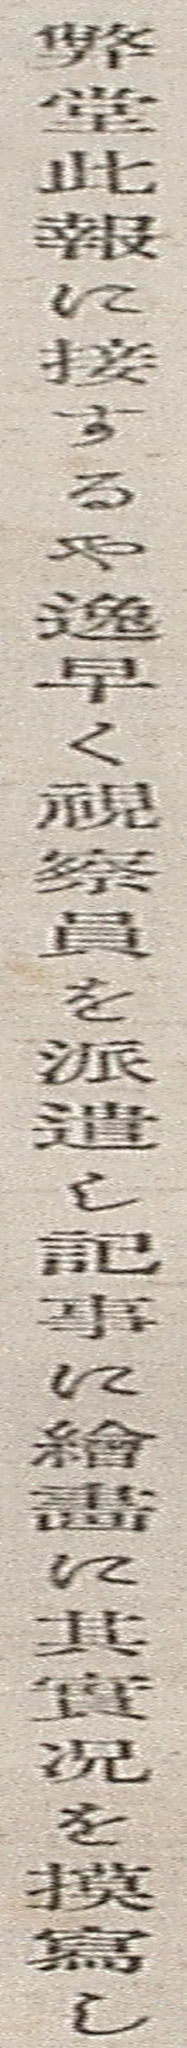弊堂此報に接するや逸早く視察員を派遣し記事に絵画に其実况を摸写し
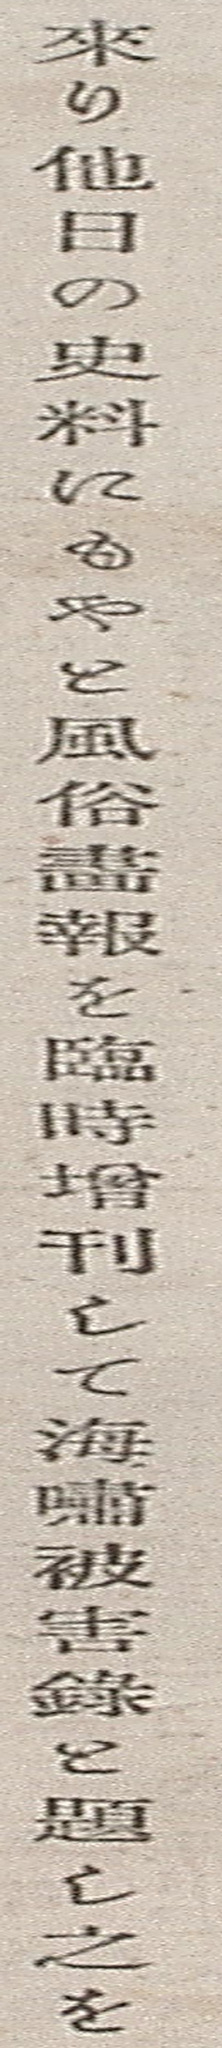来り他日の史料にもやと風俗画報を臨時増刊して海嘯被害録と題し之を
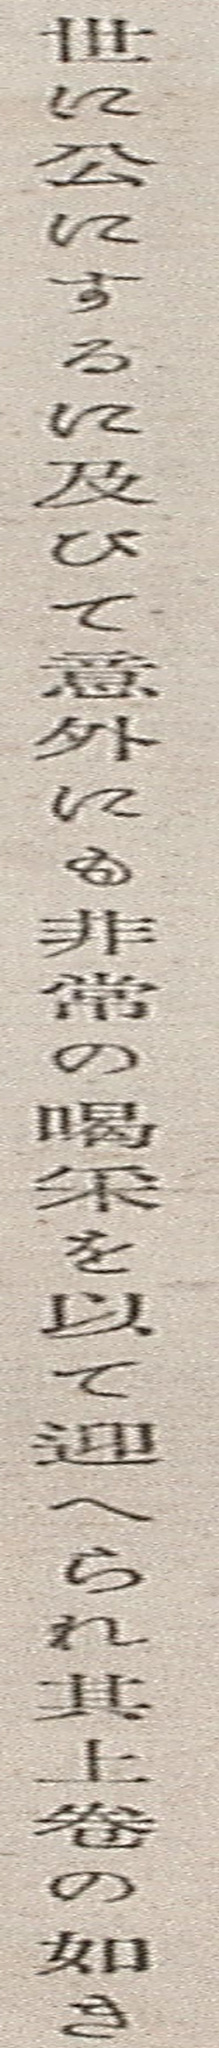世に公にするに及びて意外にも非常の喝采を以て迎へられ其上巻の如き
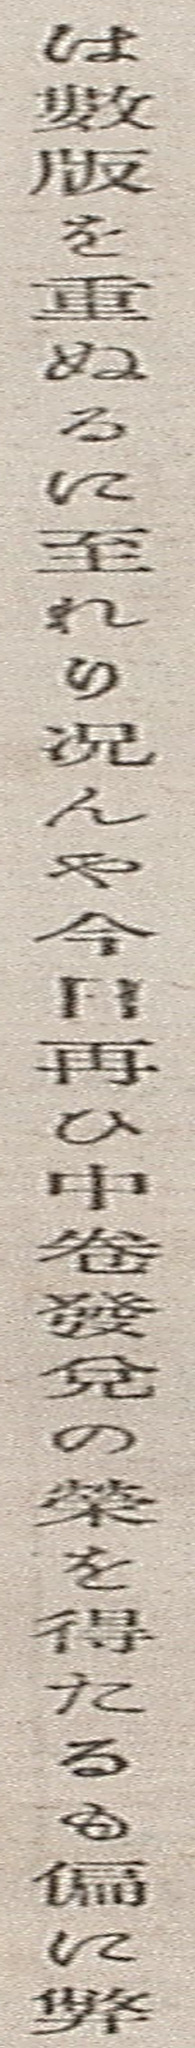は数版を重ぬるに至れり况んや今日再ひ中巻発兌の栄を得たるも偏に弊
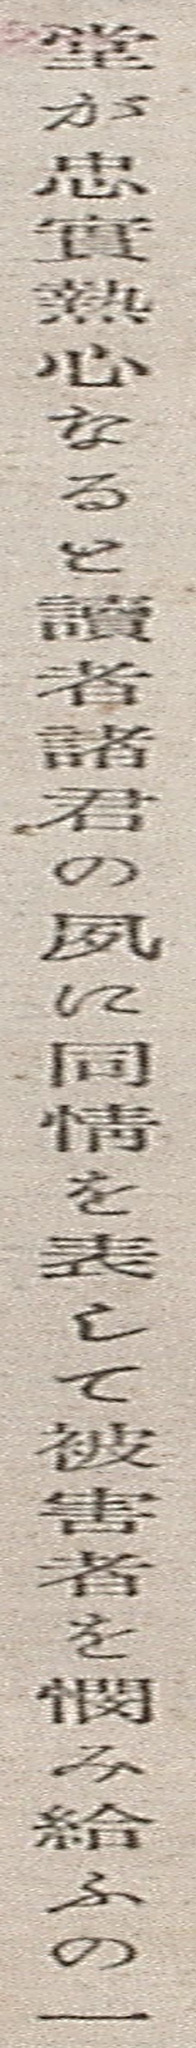堂が忠実熱心なると読者諸君の夙に同情を表して被害者を憫み給ふの一
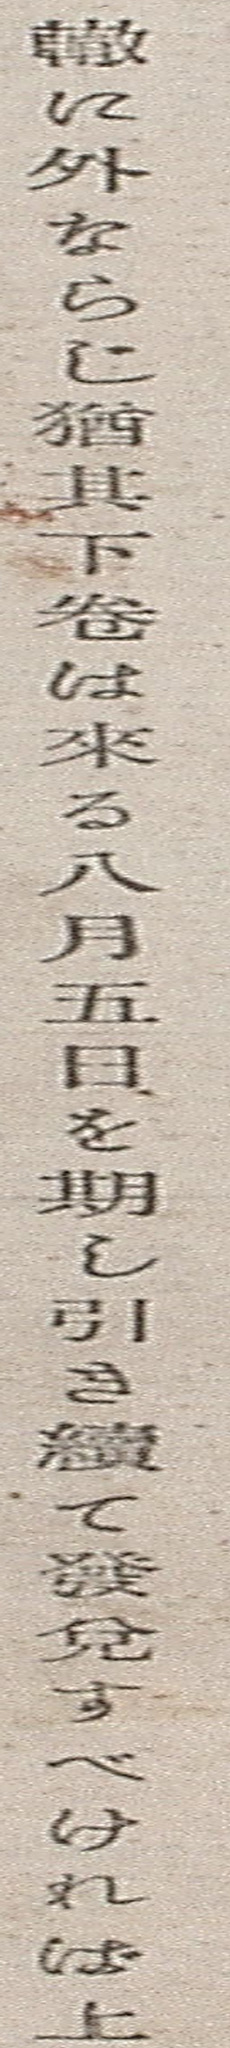轍に外ならじ猶其下巻は来る八月五日を期し引き続て発兌すべければ上
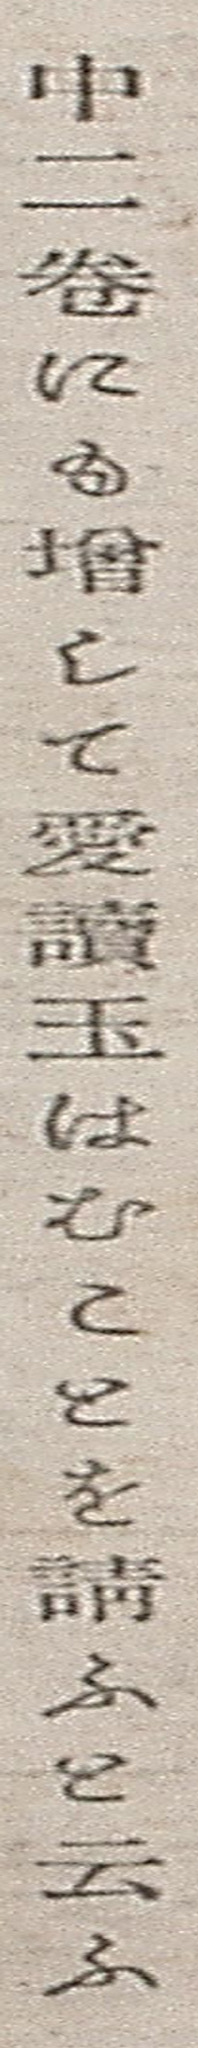中二巻にも増して愛読玉はむことを請ふと云ふ

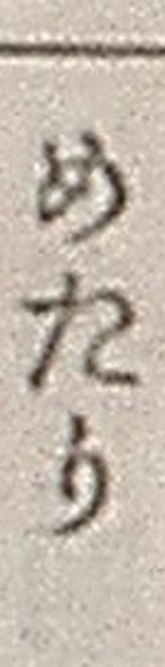めたり

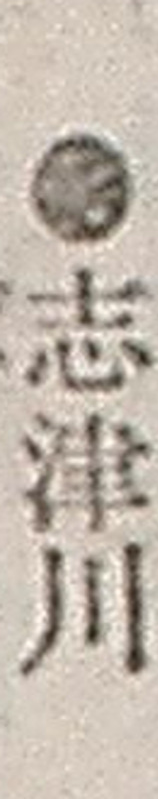●志津浜

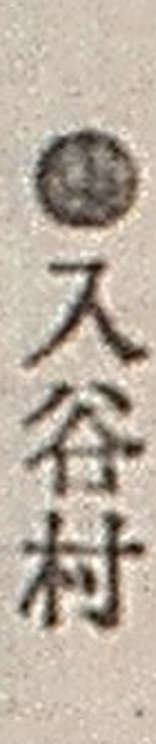●大谷村

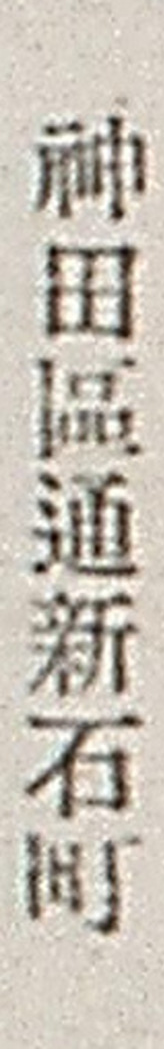神田通新石町
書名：風俗畫報臨時増刊第百十八號　大海嘯被害録（上）
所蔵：東京大学地震研究所図書室 Earthquake Research Institute Library, The University of Tokyo, JAPAN
